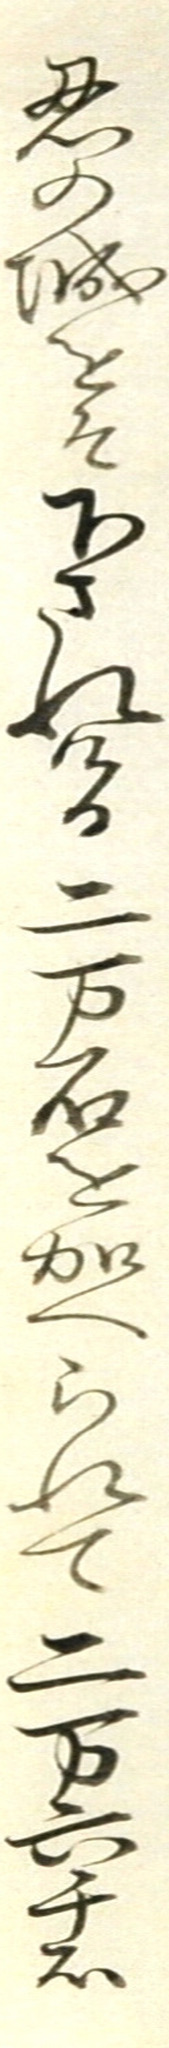忍の城をそ下されける二万石を加へられて二万六千石

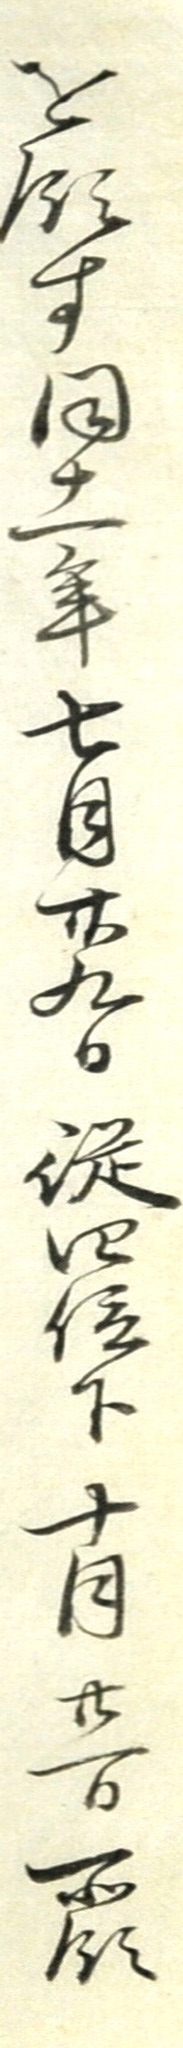を領す同十一年七月廿九日従四位下十月廿一日所領
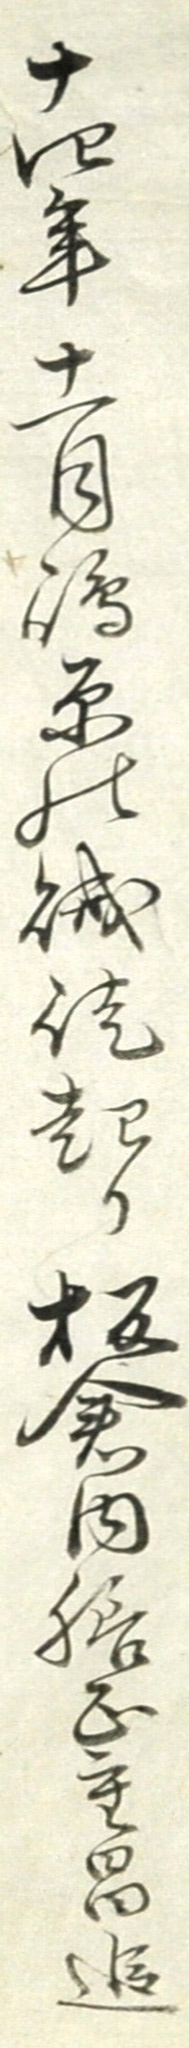十四年十一月島原の賊徒起り板倉内膳正重昌追
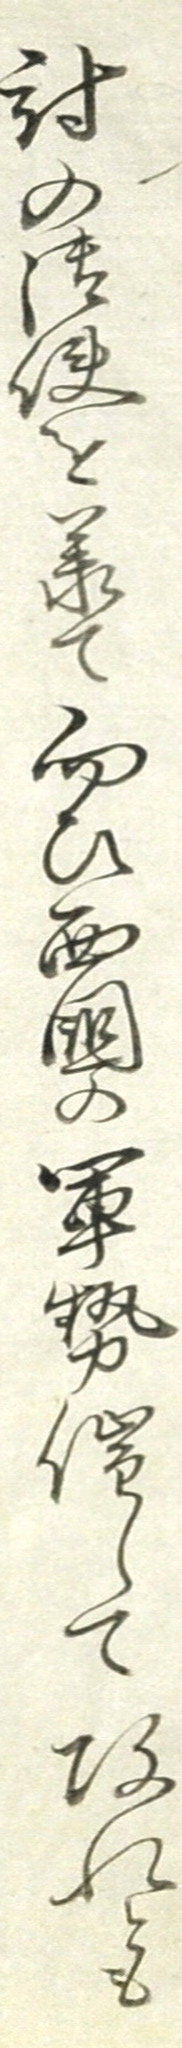討の御使を承て向ひ西国の軍勢催して攻れとも
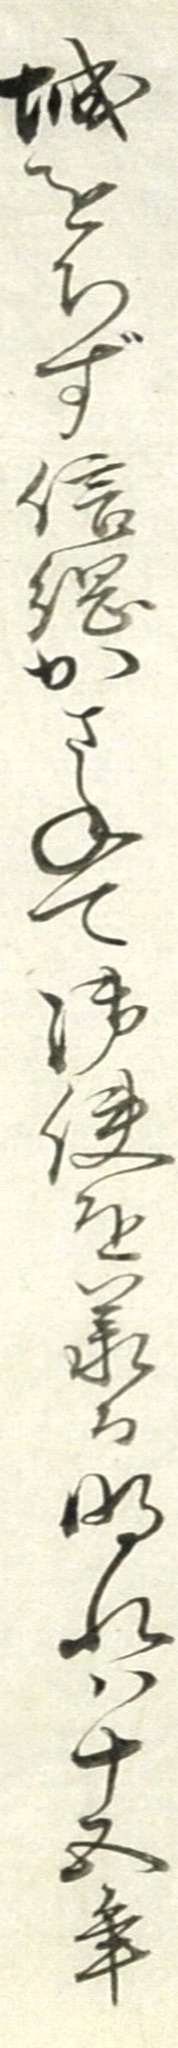城をちず信綱かさねて御使を承る明れは十五年
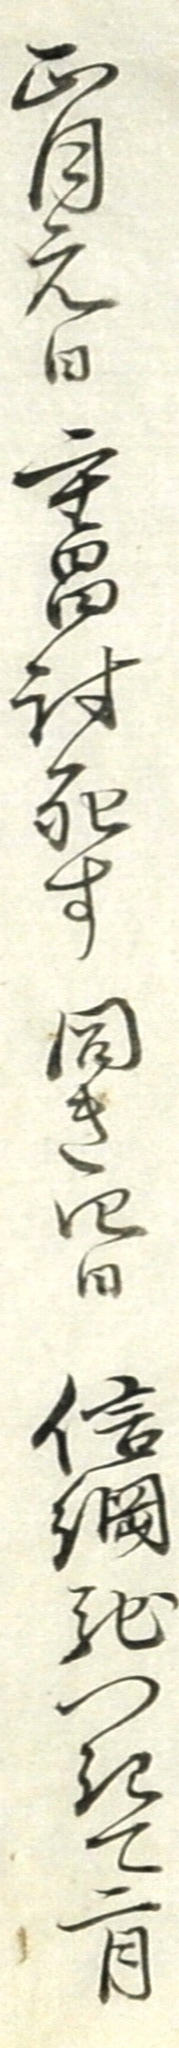正月元日重昌討死す同き四日信綱馳つきて二月
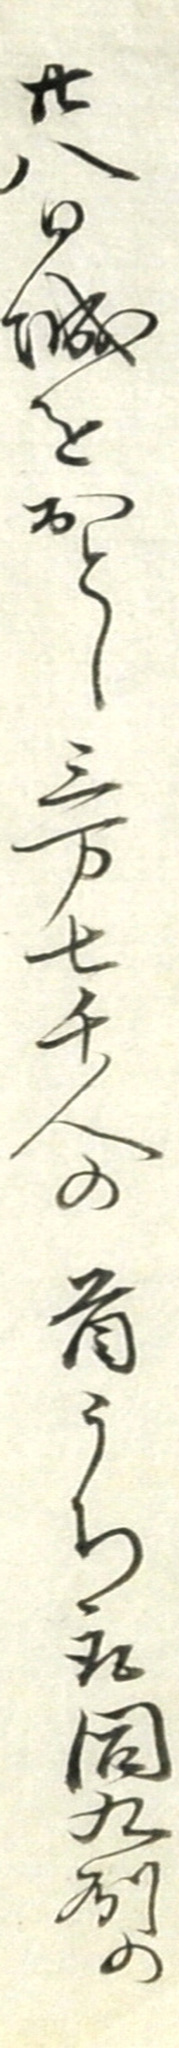廿八日城をおとし三万七千人の首うち取同九州の
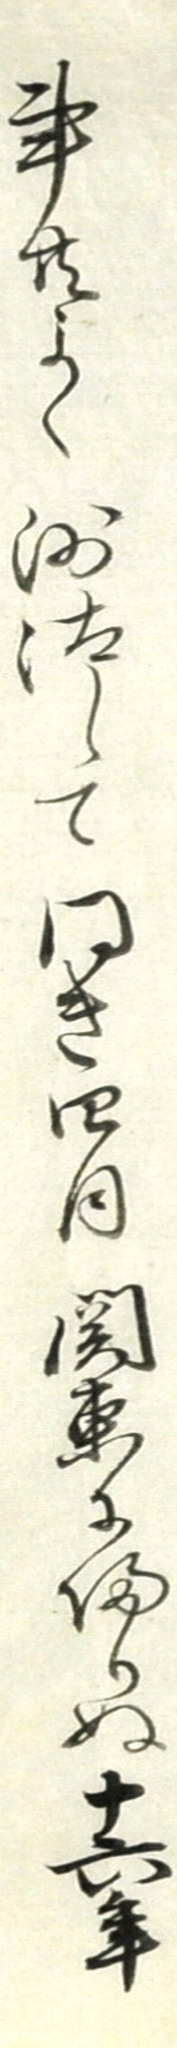事共よく沙汰して同き四月関東に帰りぬ十六年
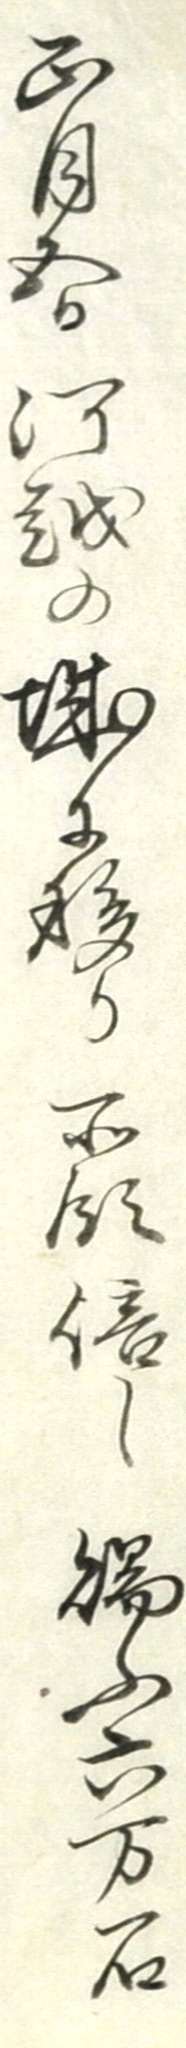正月五日河越の城に移り所領倍し賜ふ六万石
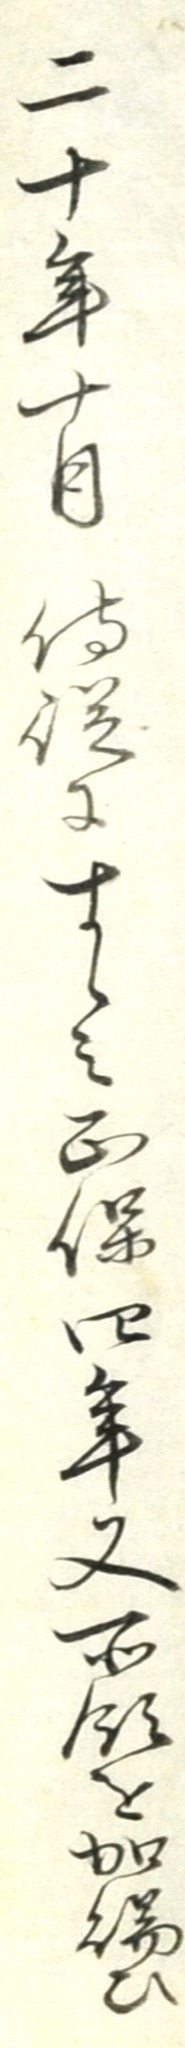二十年十月侍従にすゝみ正保四年又所領を加賜ひ

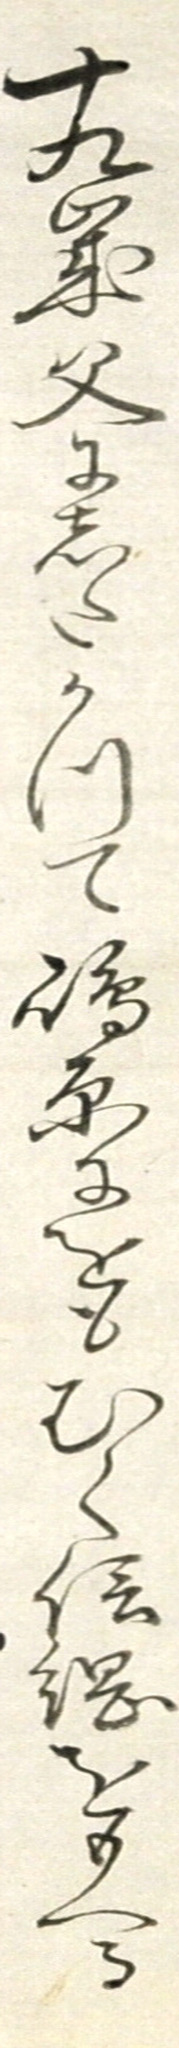十九歳父にしたかつて島原にをもむく信綱をもへる
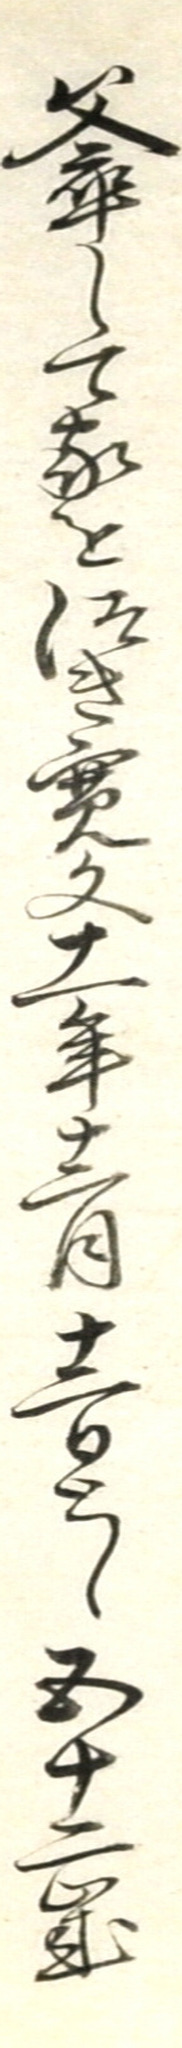父卒して家をつき寛文十一年十二月十二日とし五十二歳
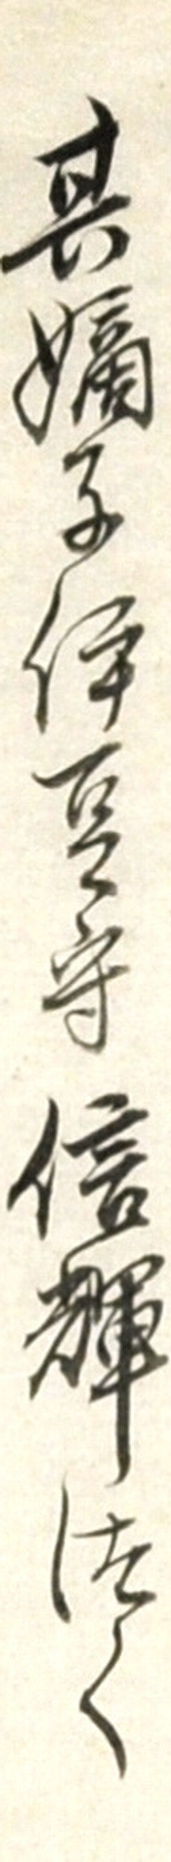其嫡子伊豆守信輝つく

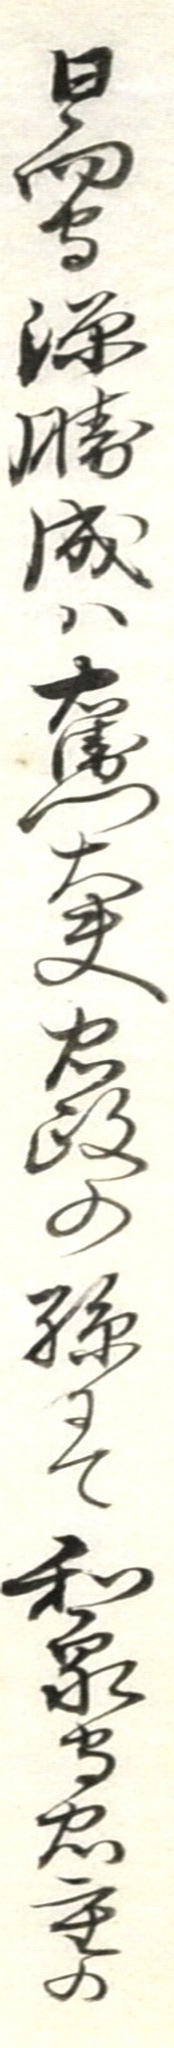日向守源勝成は右衛門大夫忠政の孫にて和泉守忠重の
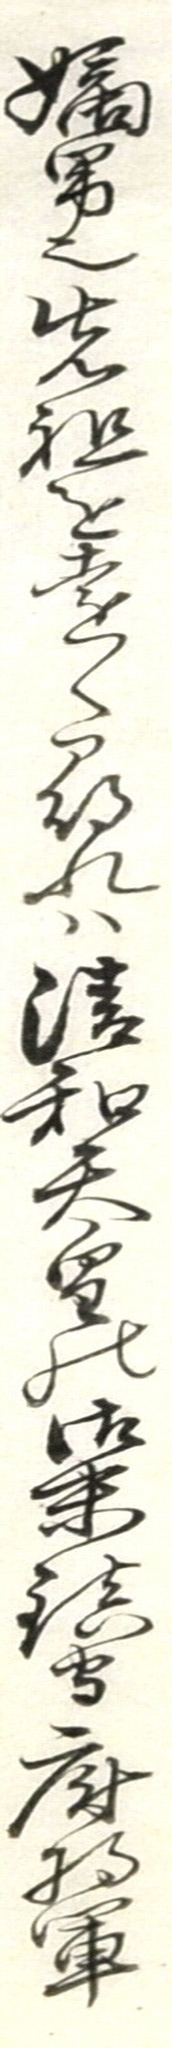嫡男也先祖を遠く尋れは清和天皇の御末鎮守府将軍
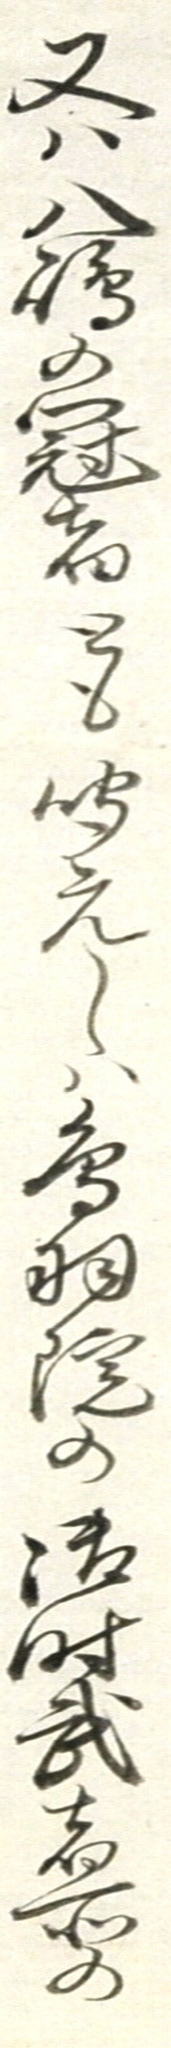又は八島の冠者とも聞えしは鳥羽院の御時武者所の
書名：藩翰譜（二・三）
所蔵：伊那市立高遠町図書館・合同会社AMANE
